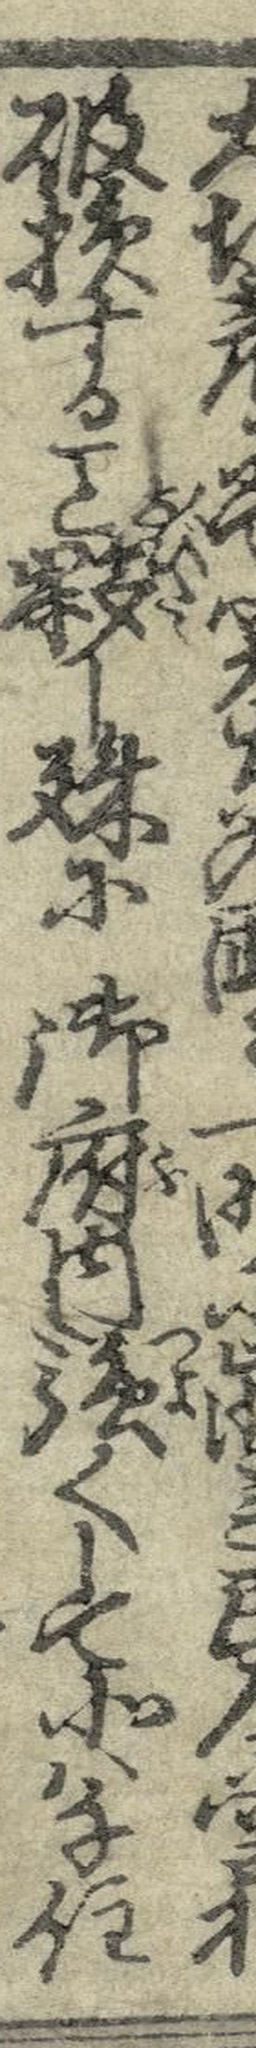破損すること夥し殊に御府内強くして北は千住
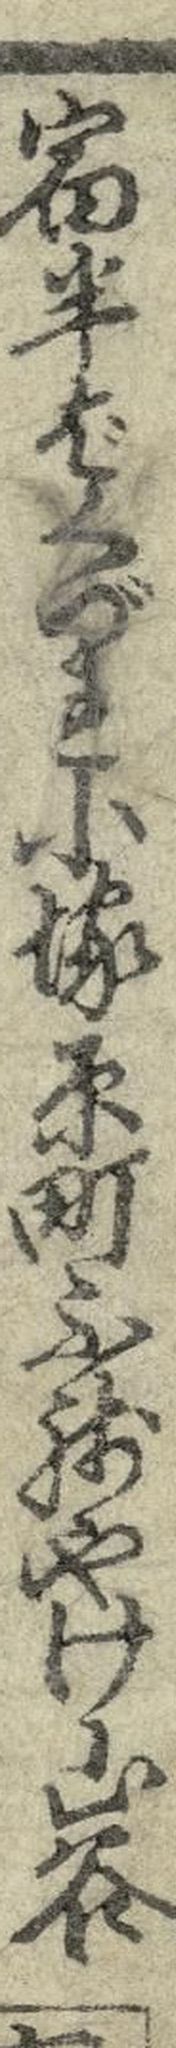宿半ばくづれ小塚原町不残やけ山谷
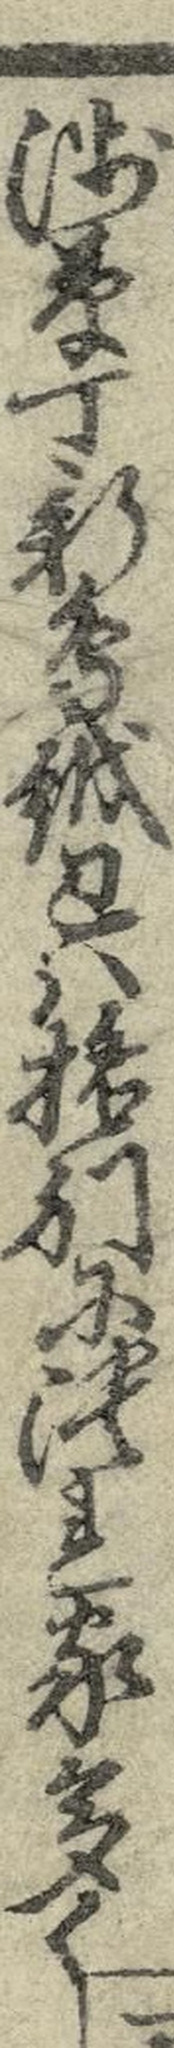浅草丁新鳥越辺は格別に潰れ家多く
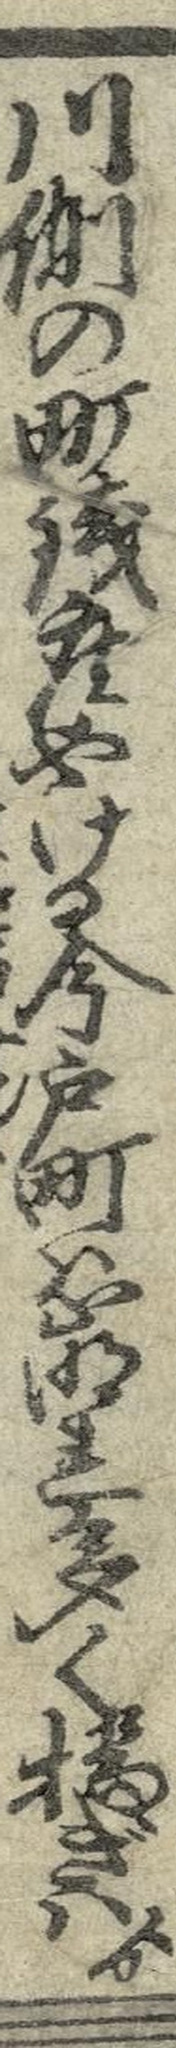川側の町銭座やける今戸町は崩れ多く橋ぎはゟ
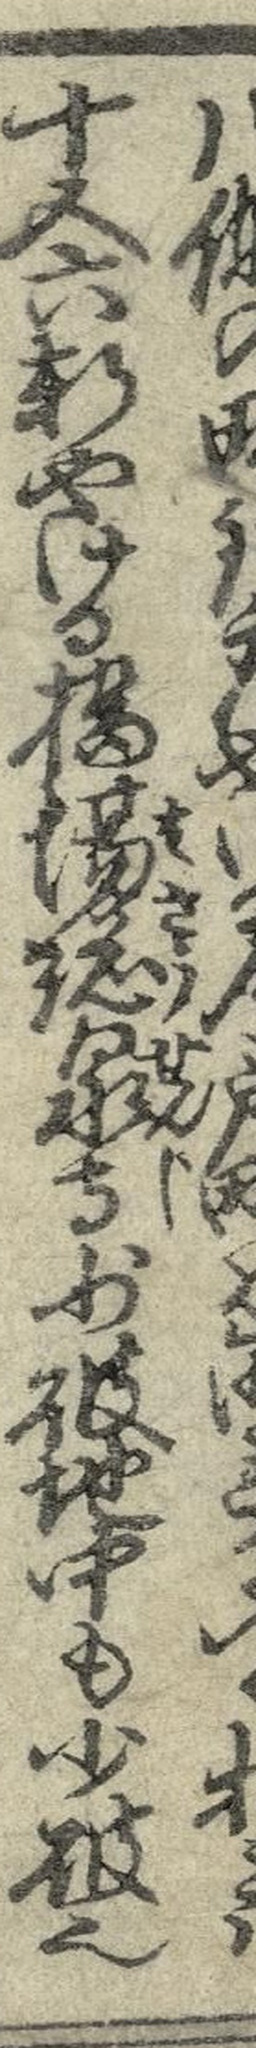十五六軒やける橋場総泉寺少破地中も少破也
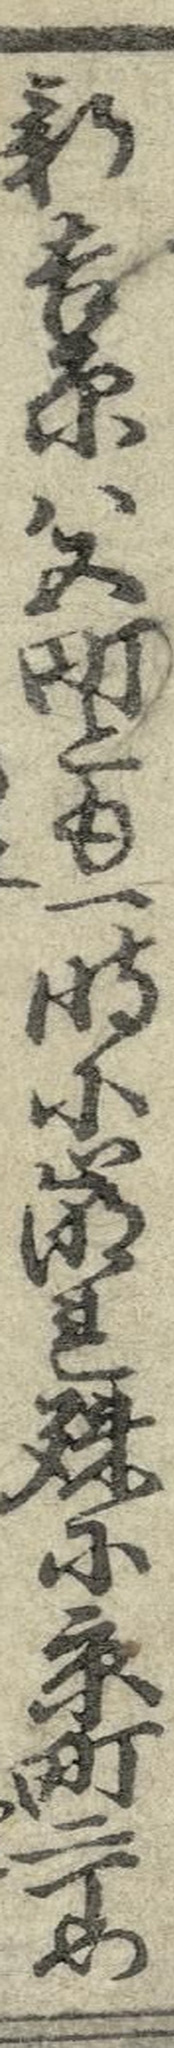新吉原は五町とも一時に崩れ殊に京町二丁め
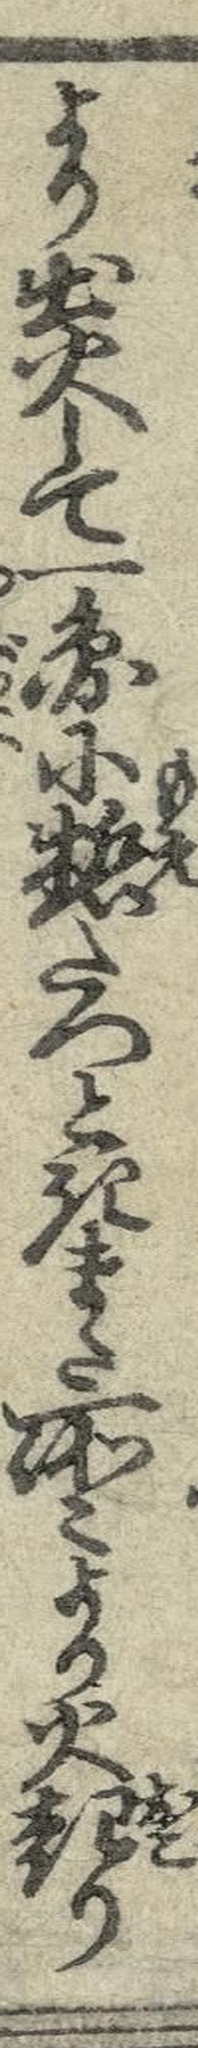より出火して一円に焚たつときまた所により火起り
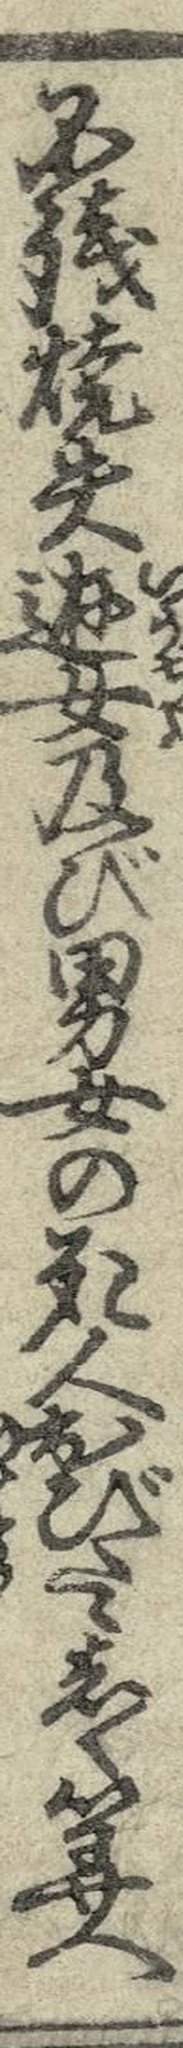不残焼失遊女及び男女の死人おびたヽしく算へ
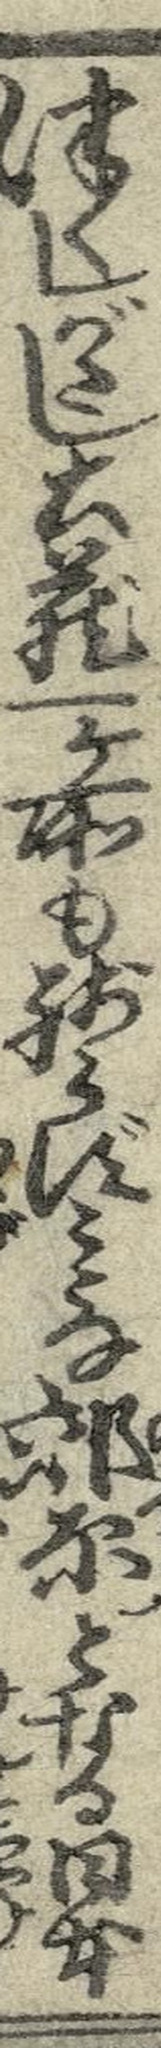つくしがたし土蔵一ヶ所も残らずみな郊原となる日本
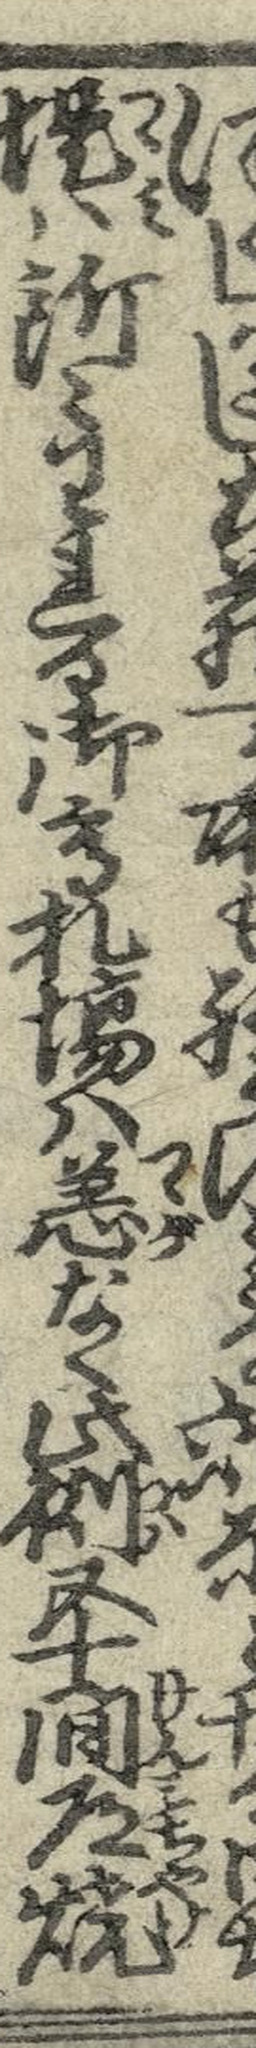堤は所々われる御高札場は恙なく此側五十間道焼
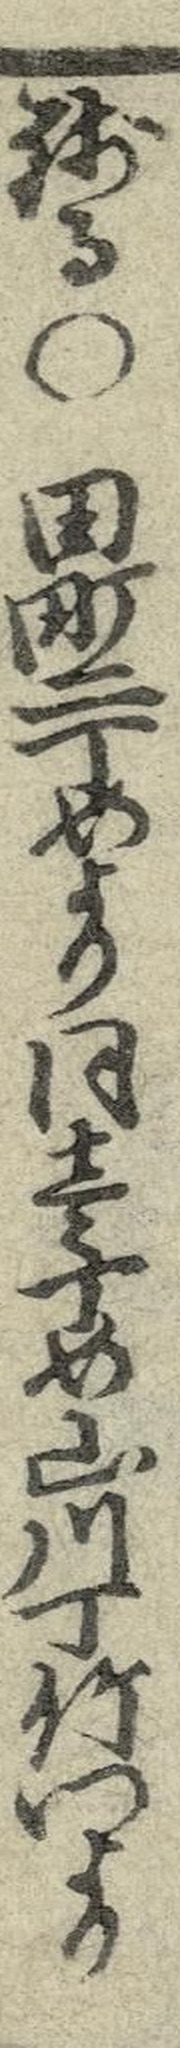残る○田町二丁めより同壱丁め山川丁竹門より
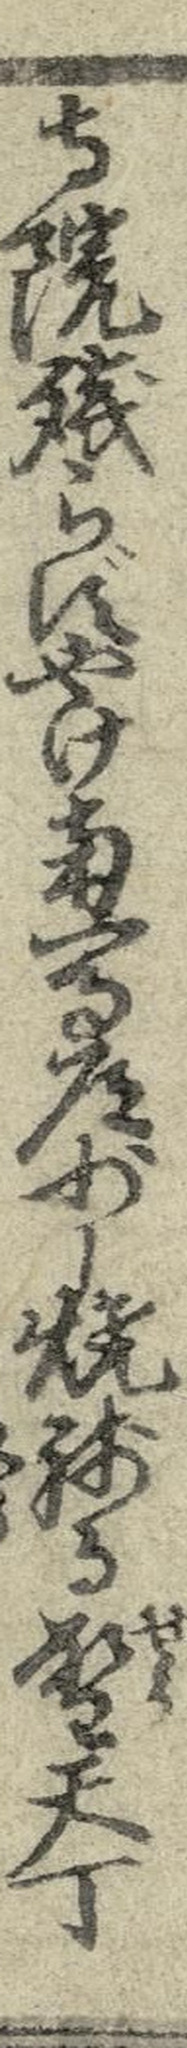寺院残らずやけ南馬道少し焼残る聖天丁
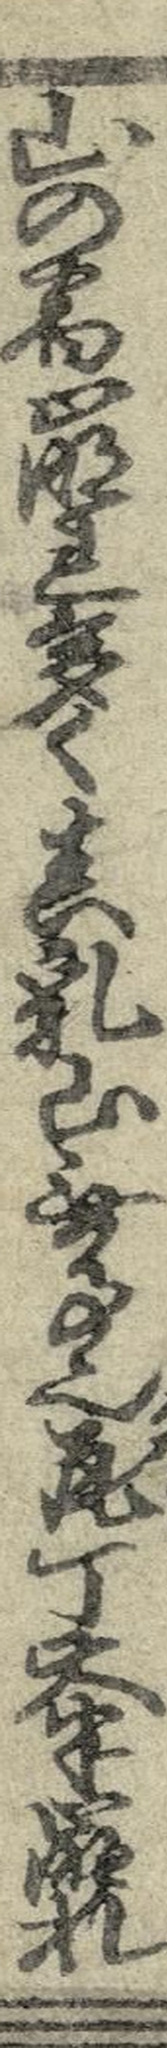山の宿崩れ多く真乳山無事也瓦丁大半崩れ
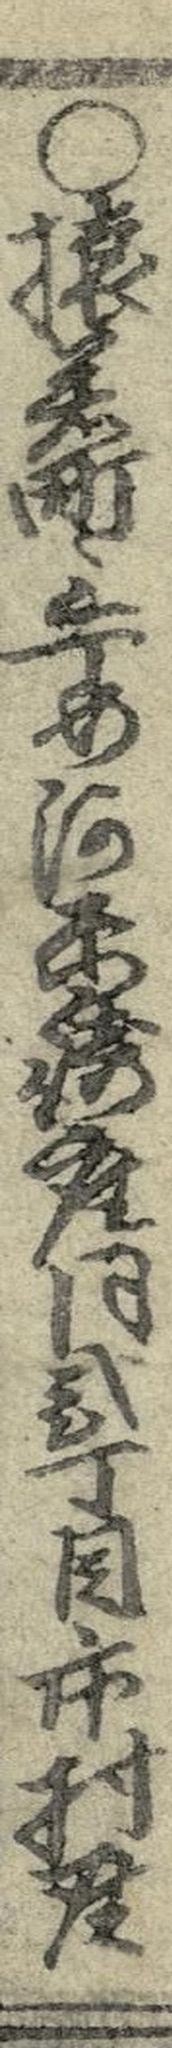○猿若町三丁め河原崎座同弐丁目市村座
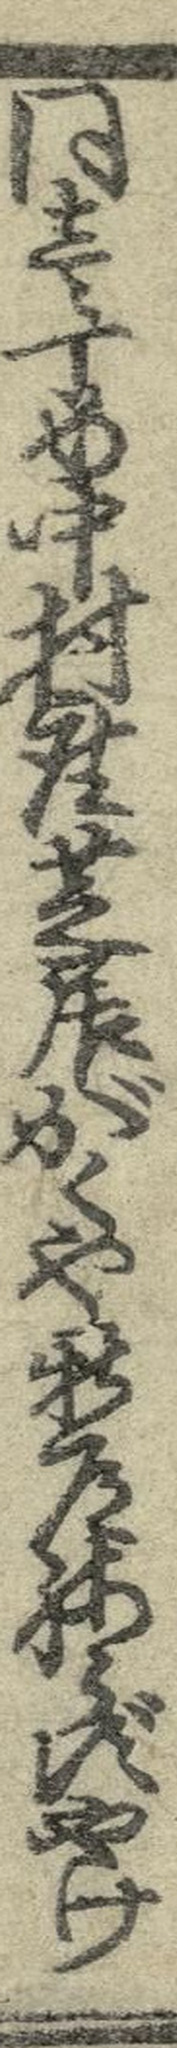同壱丁め中村座芝居がくや新道殘らずやけ
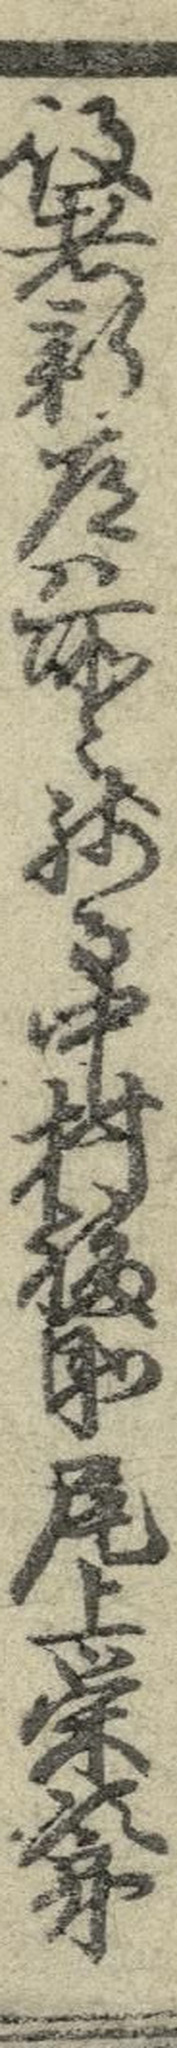役者新道ハ所〻殘る中村福助尾上榮次郎
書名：地震並出火細見記
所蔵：東京大学地震研究所図書室 Earthquake Research Institute Library, The University of Tokyo, JAPAN
